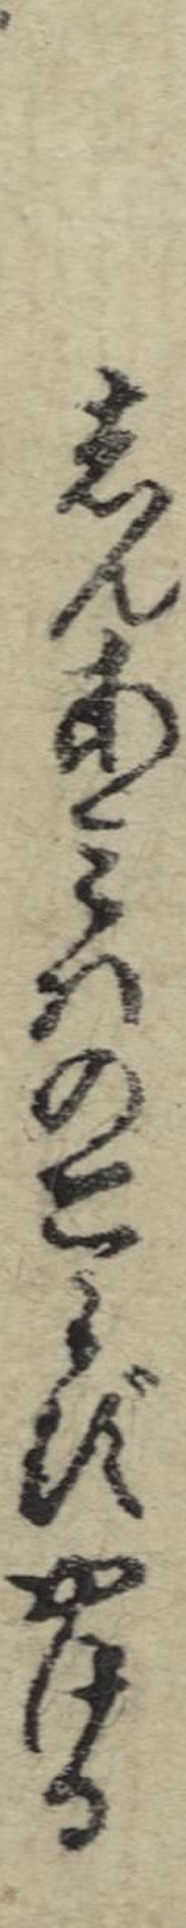しんあみはのこらずやける
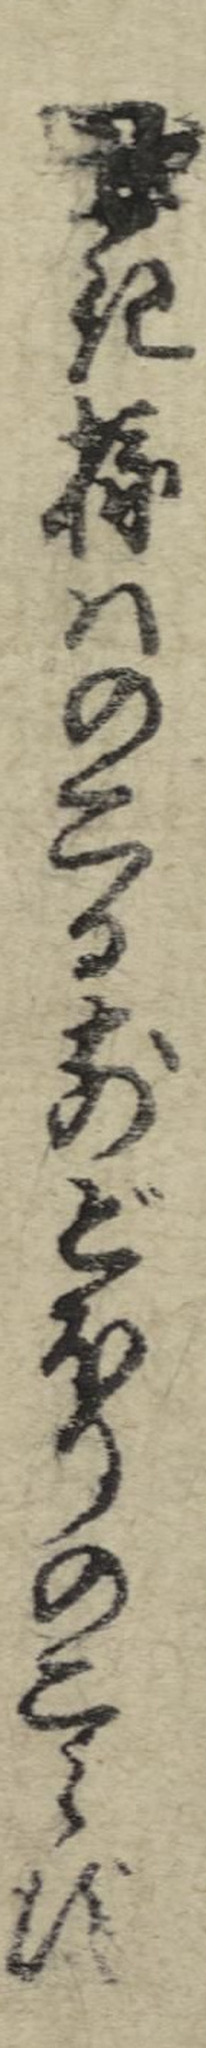紀様はのこる前どほりのこらず
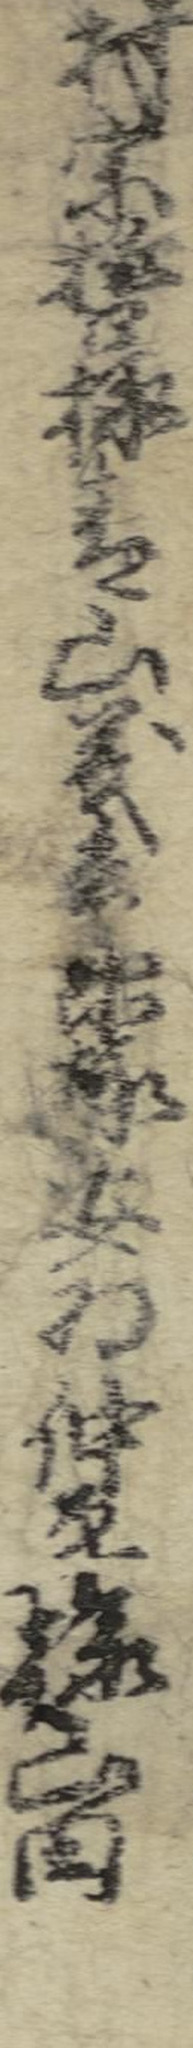村宗様青山義兵様安藤仲友様山田
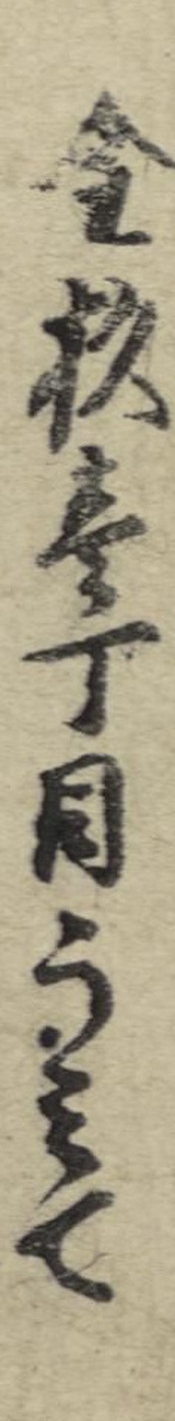金杉壱丁目うみて
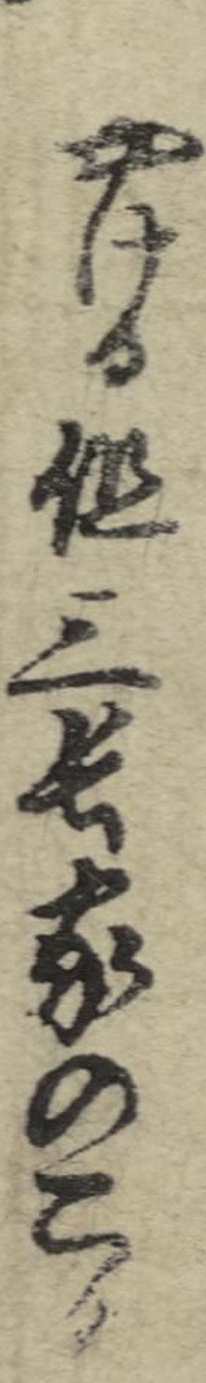やける但三長家のこる
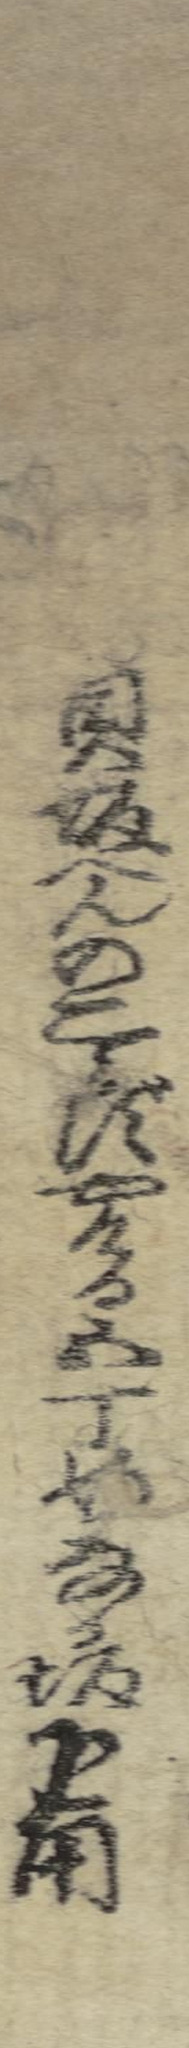貝坂へんのこらずやける五丁めなか坂下角
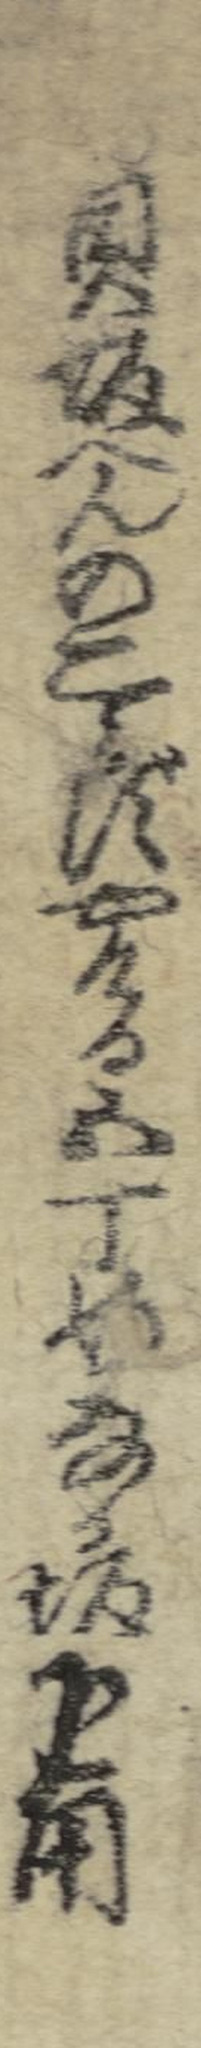貝坂へんのこらずやける五丁めなか坂下角
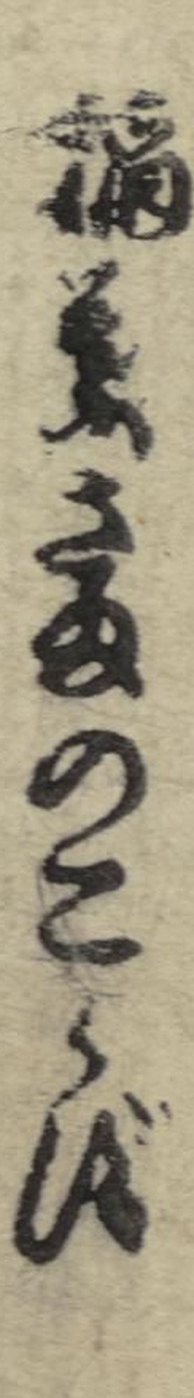稲葉さまのこらず
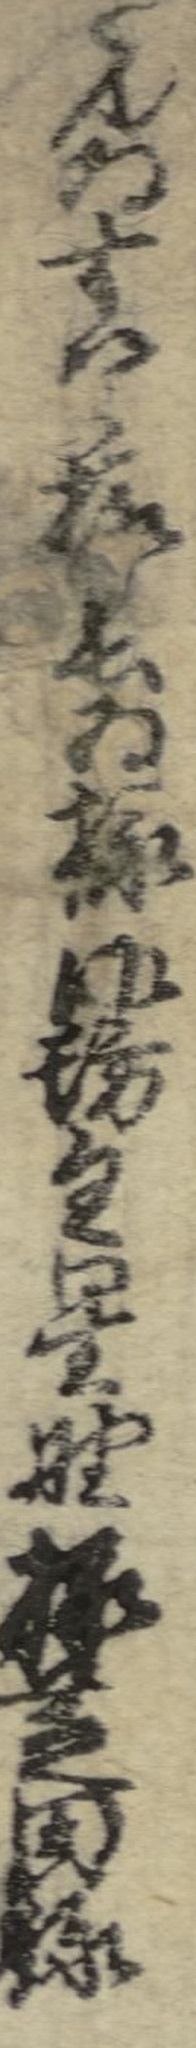てんゐすはら様長ゐ様御坊主星野様芝田様
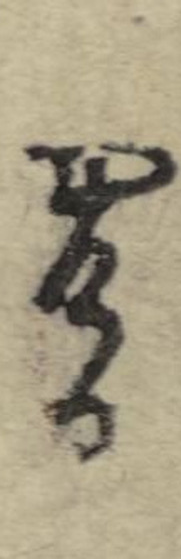やける
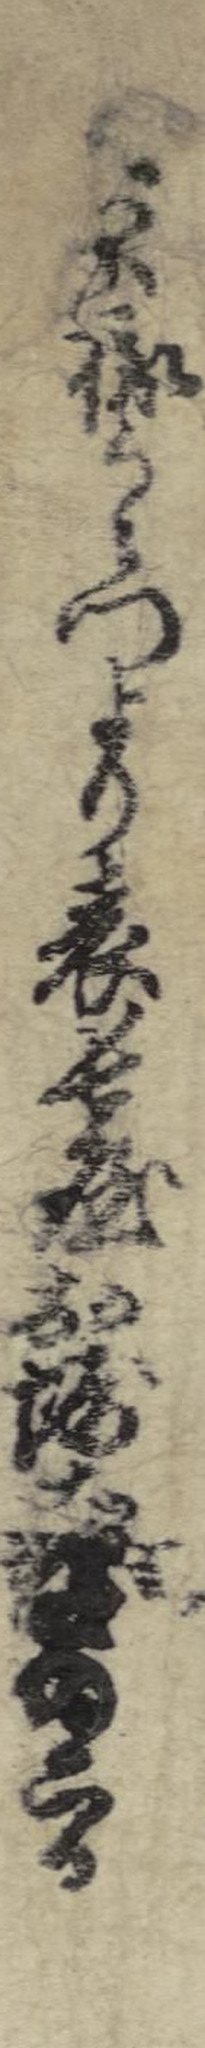様うら門より表長屋お堀こか
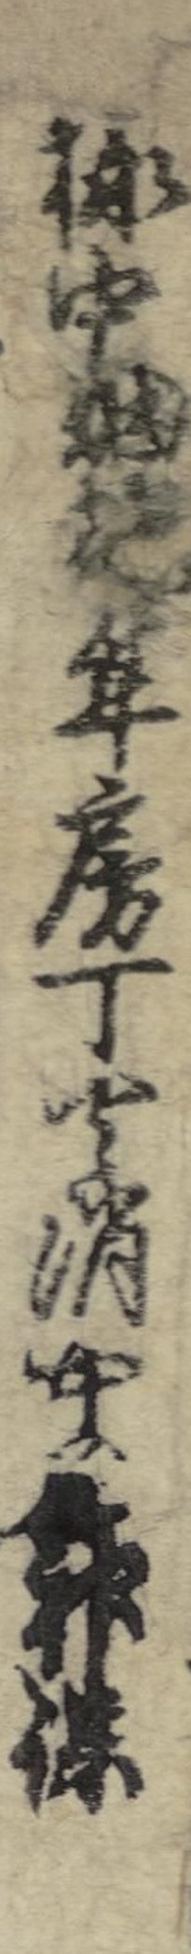様中越花隼房丁火消やけ神保
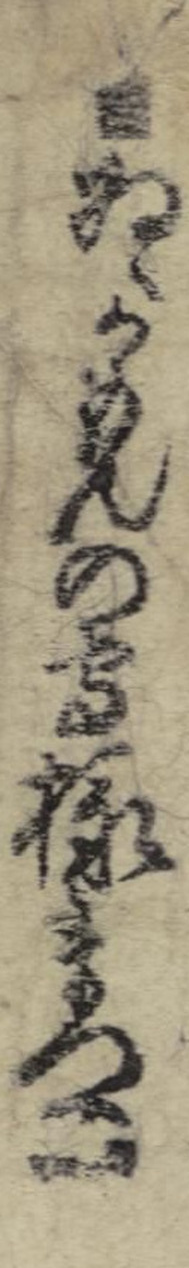ゐゝかもんの守様まつ
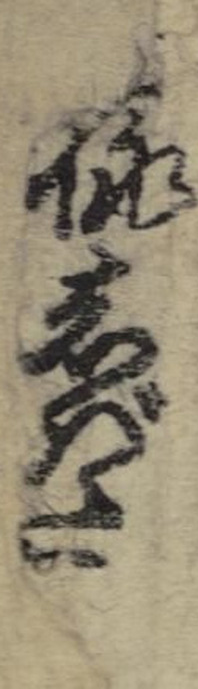様しばた
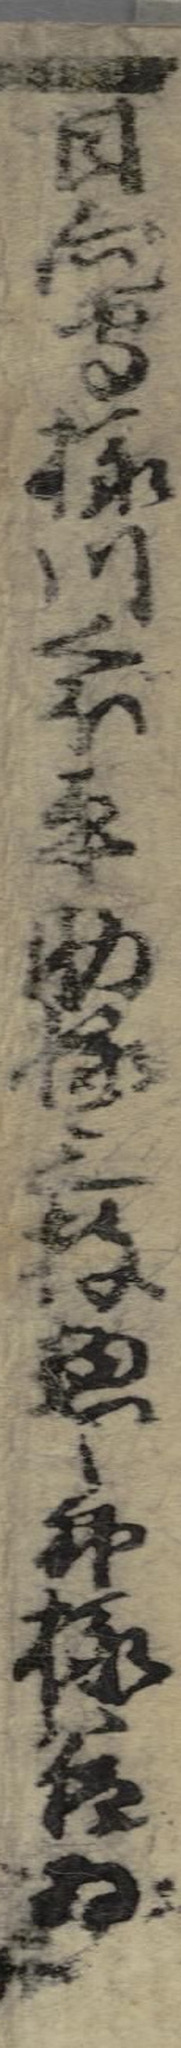日向守様川くほ平助様三枝惣し郎様谷ゐ
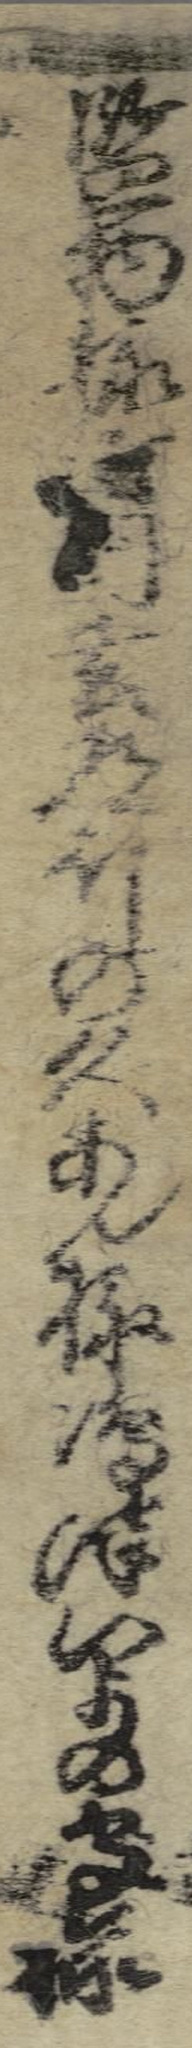監物様道外の久あん様嶋津いよの守様
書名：[嘉永三年二月の江戸大火に関する瓦版]
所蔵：東京大学地震研究所図書室 Earthquake Research Institute Library, The University of Tokyo, JAPAN
